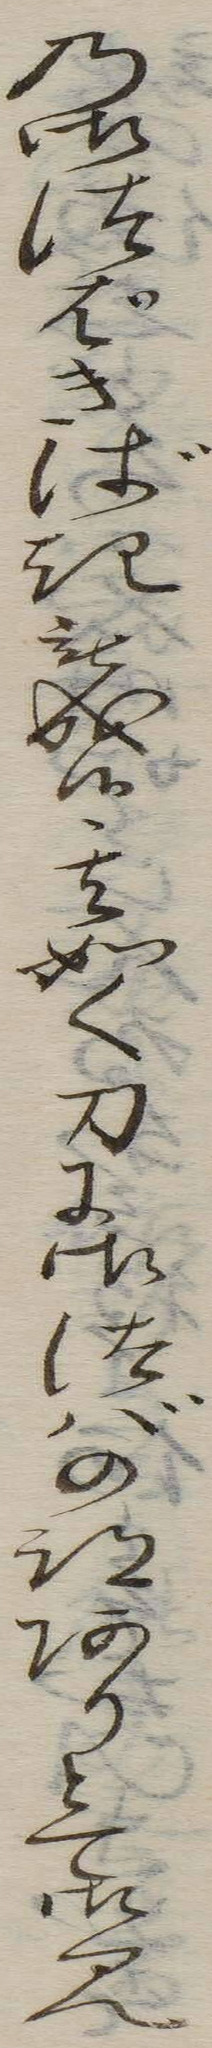の御つばきばき被成候其如く刀に御つばの跡ありとて御見
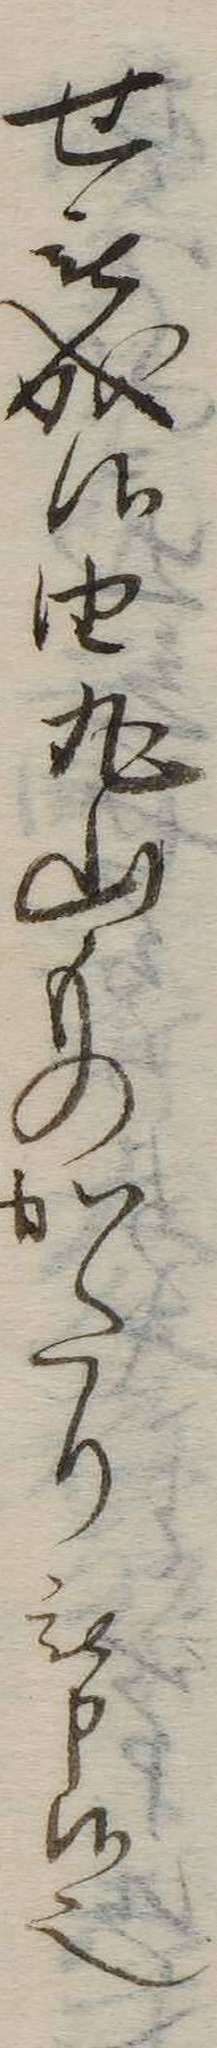せ被成候由丸山ものかたり被申候也
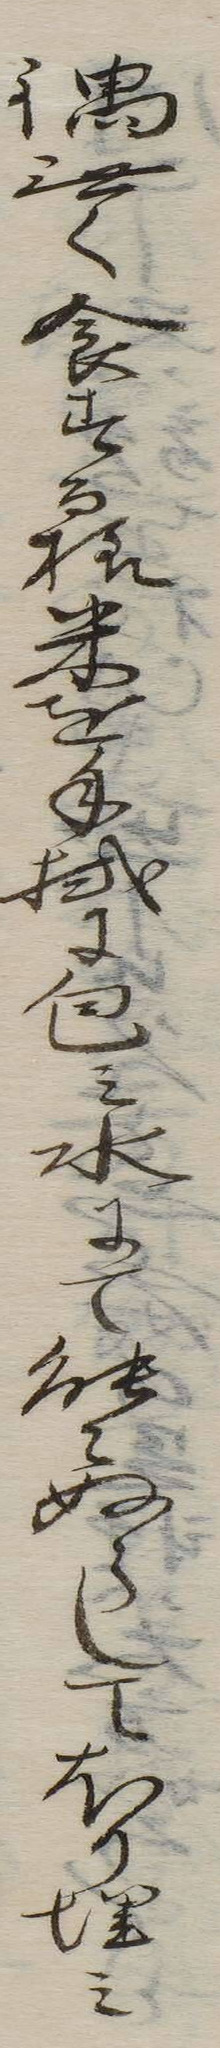一鍋無く食する様米を手拭に包み水にて能々ぬらしてほり埋み
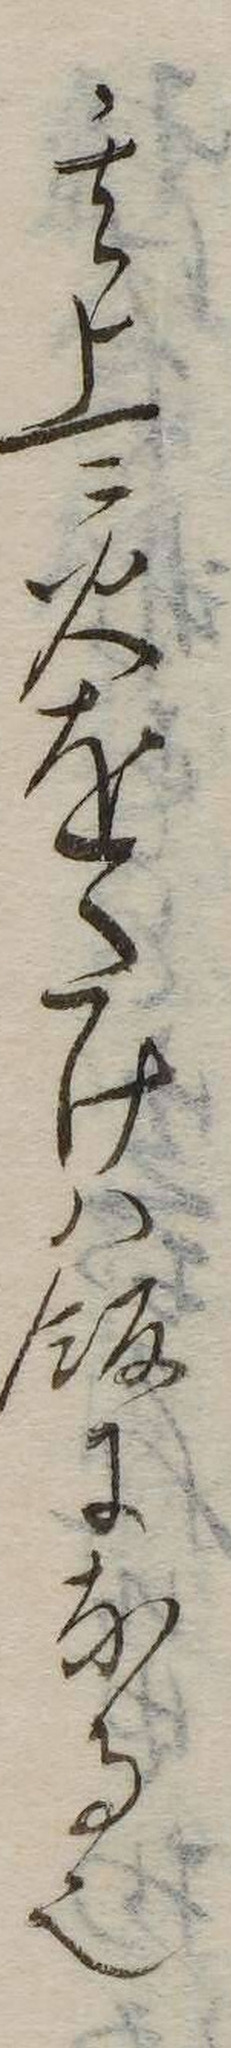其上ニ火をたけは飯になる也
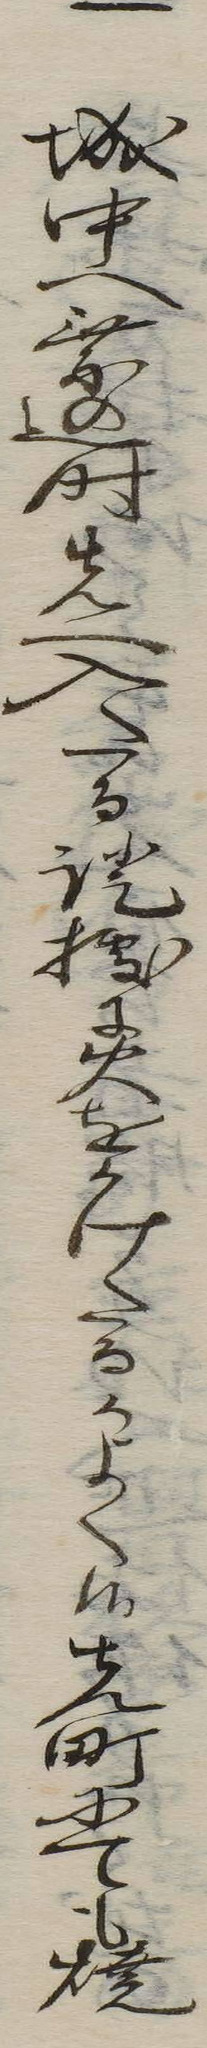一城中へ乗廻時先へ入たる証拠に火をかけたるかよく候先町にても焼
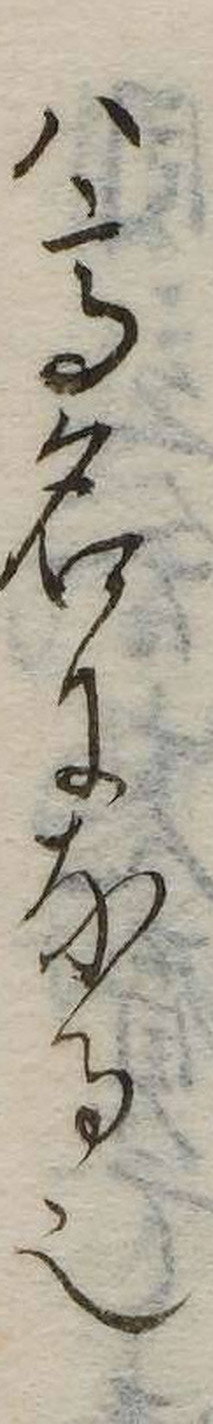は高名になる也
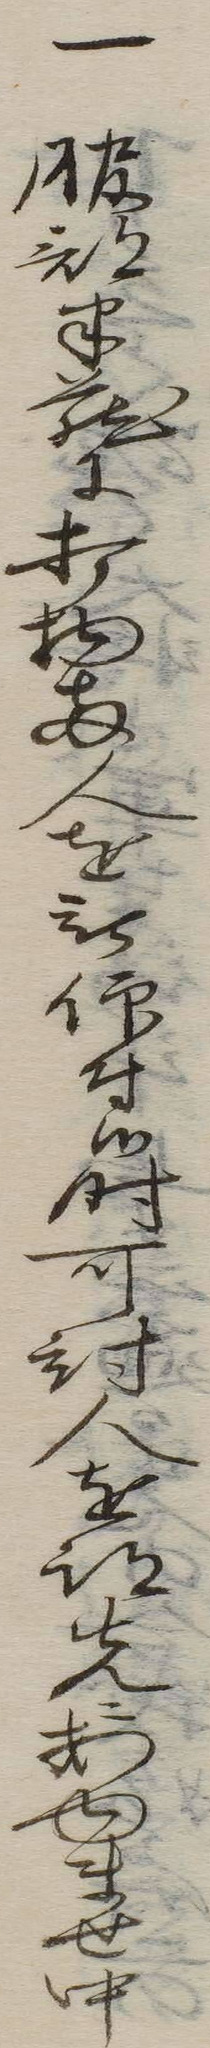一服部半蔵に打物両人を被仰付候時可討人を跡先ニあゆませ中
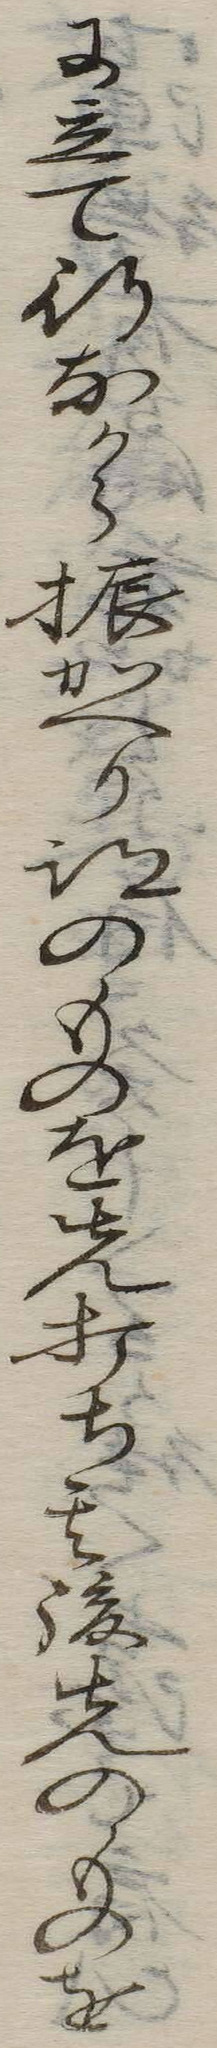に立て跡なから振かへり跡のものを先打ち其後先のものを
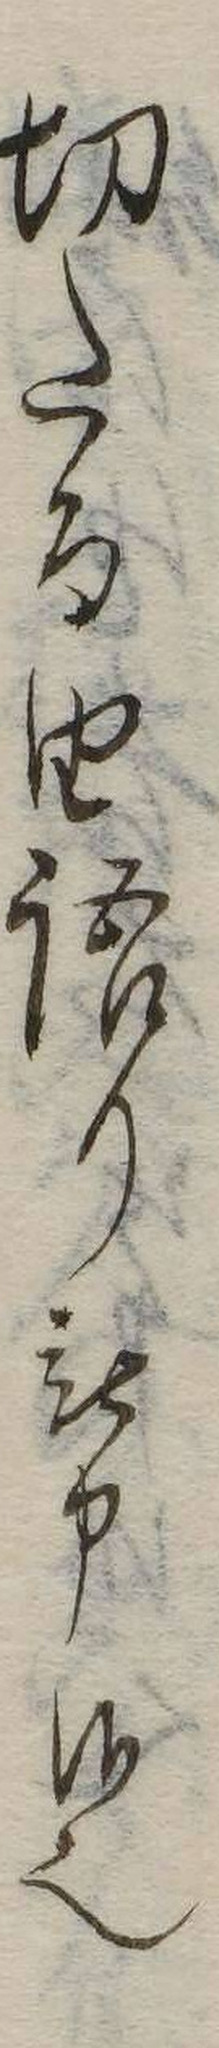切たる由語り被申候也
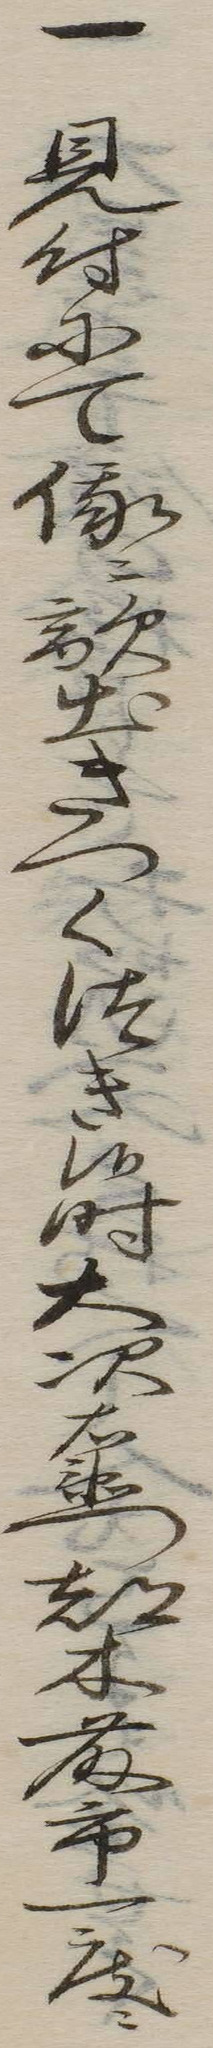一見付にて俄ニ敵出きつくつき候時大沢右衛門都木藤市一度ニ
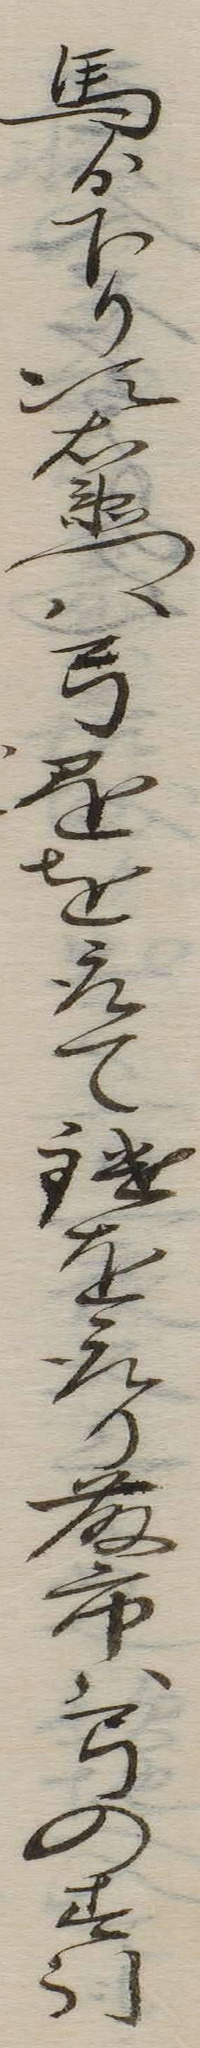馬ゟ下り次右衛門は弓懸を取て鑓を取り藤市は弓のす引
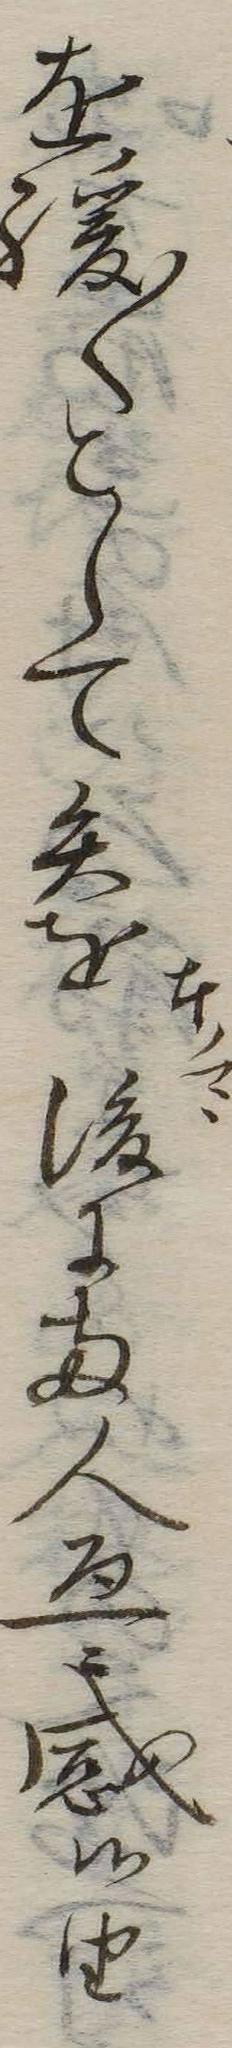を駿〳〵として矢を後に両人互ニ感候由
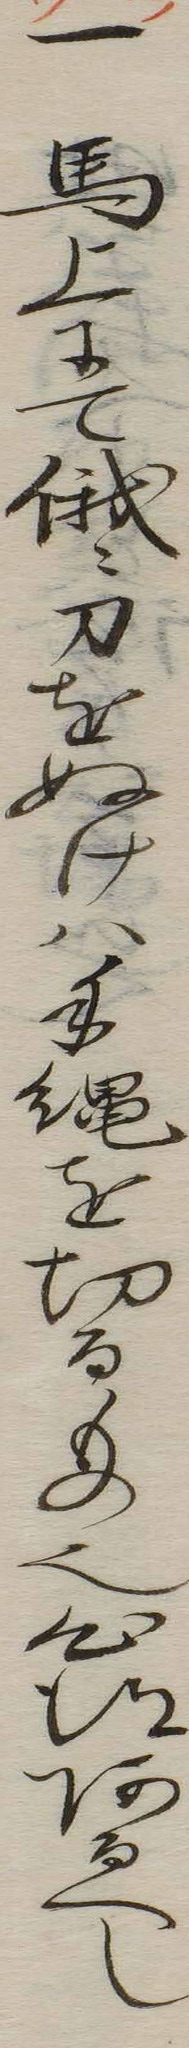一馬上にて俄ニ刀をぬけは手縄を切るもの也心得あるへし
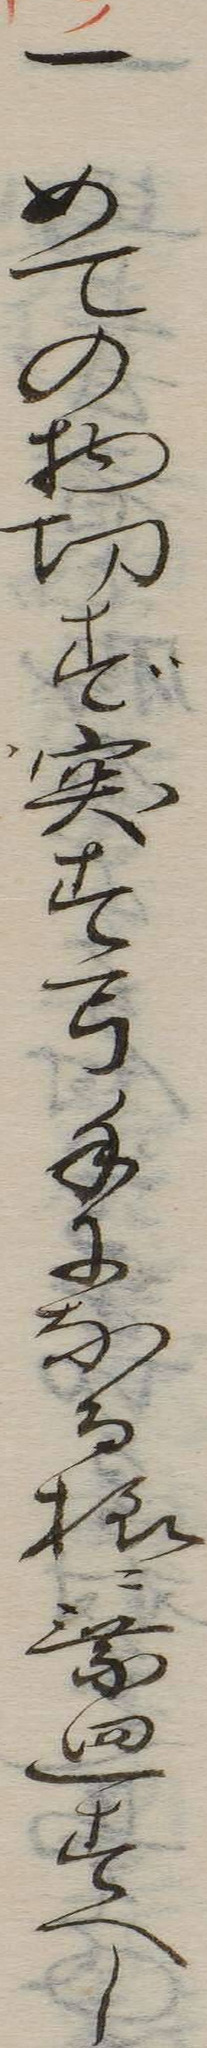一めての物切ず突す弓手になる様に乗廻すへし
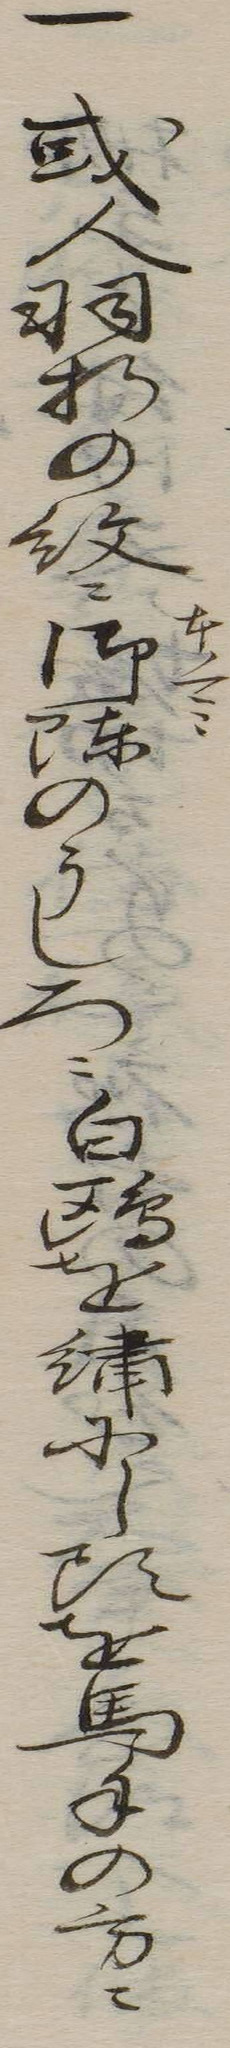一或人羽折の紋ニ御陣のうしろニ白鴎を繍にし頭を馬手の方ニ
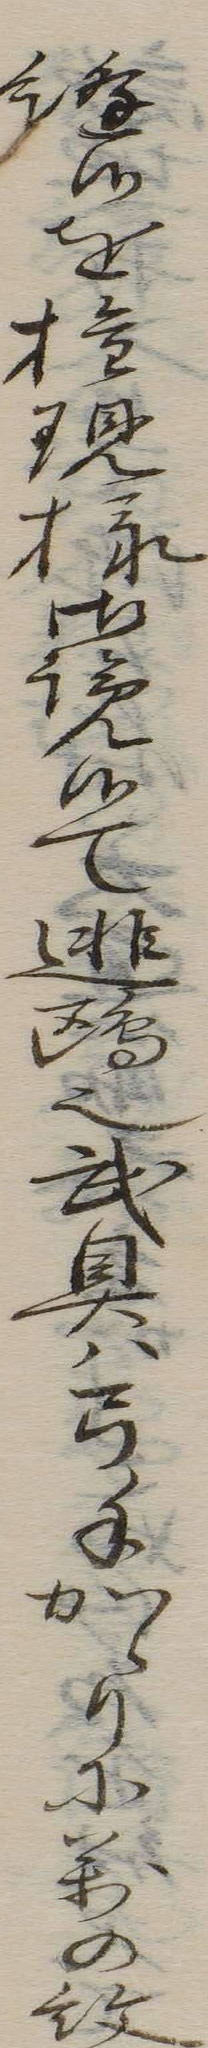縫候を権現様御覧候て逃鴎也武具は弓手かゝりに万の紋
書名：三河之物語
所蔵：国文学研究資料館
